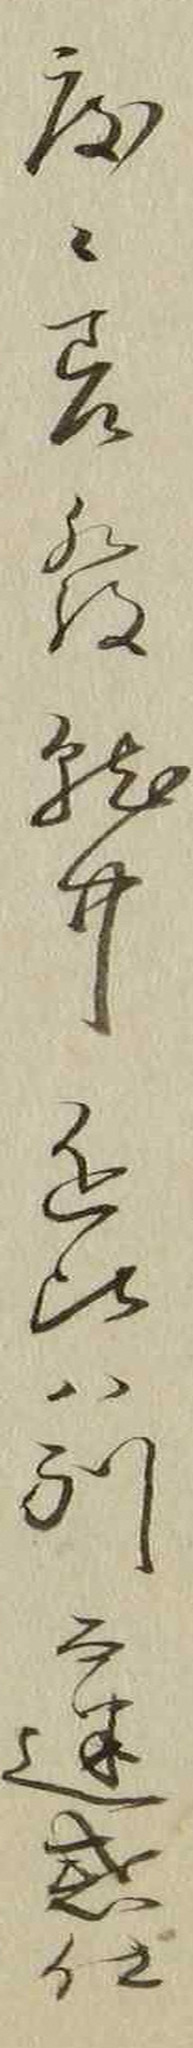度々着発就中近比ハ別而迷惑仕
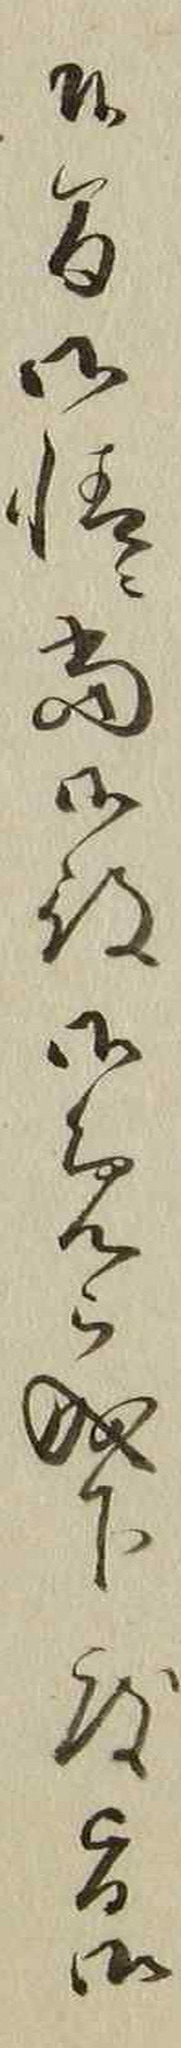候間御情ニ当御役御免被成下度旨御
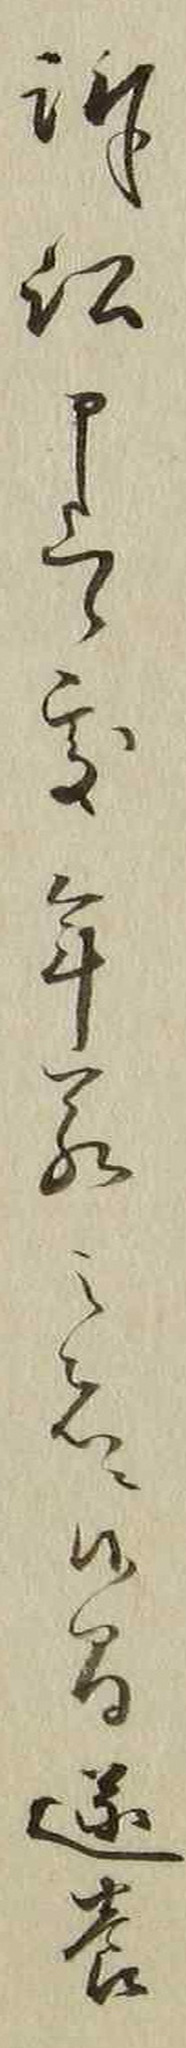訴訟申上候処年若之者ニ候間遂養
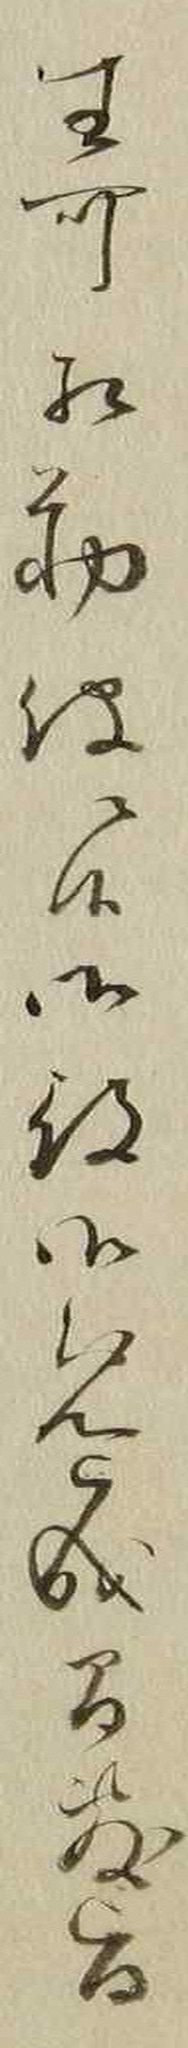生可相勤儀ニ候御役御免被成間敷旨
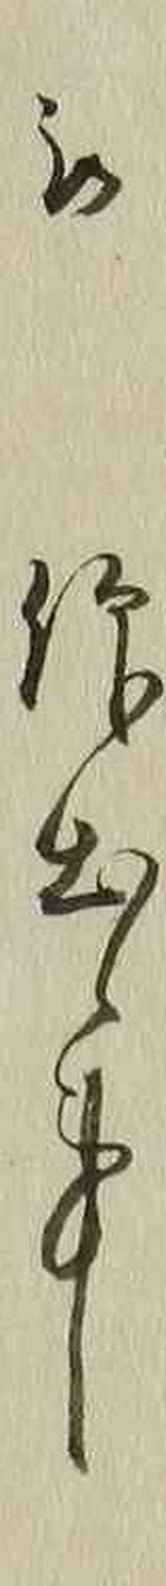被仰出候事
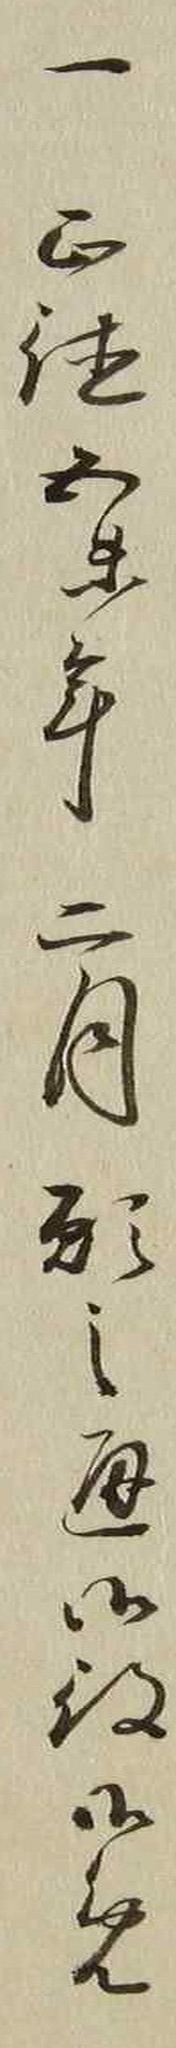一正徳五未年二月願之通御役御免
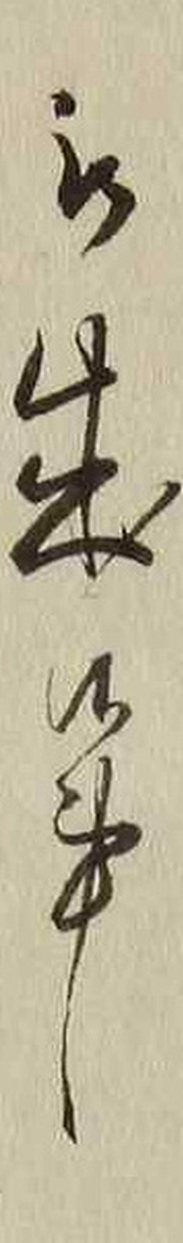被成候事
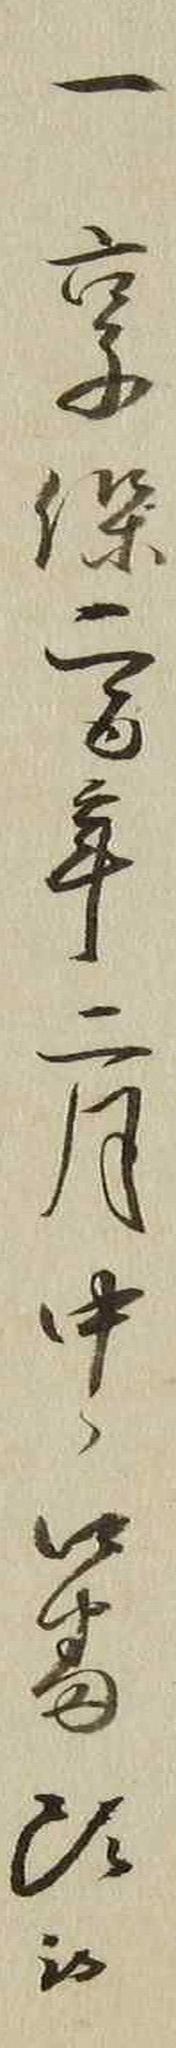一享保二酉年二月中ノ口番頭被
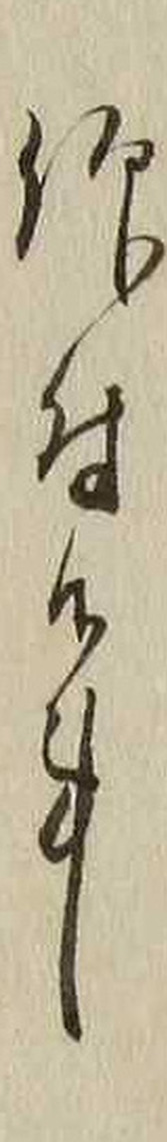仰付候事
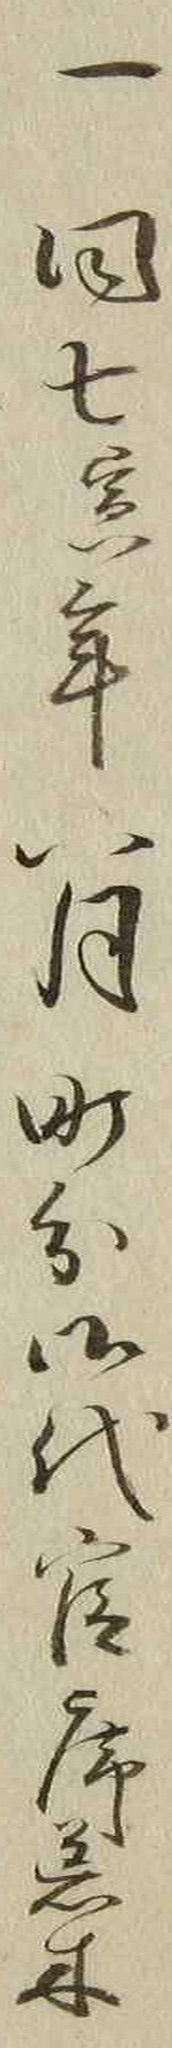一同七寅年八月町分御代官席荒木
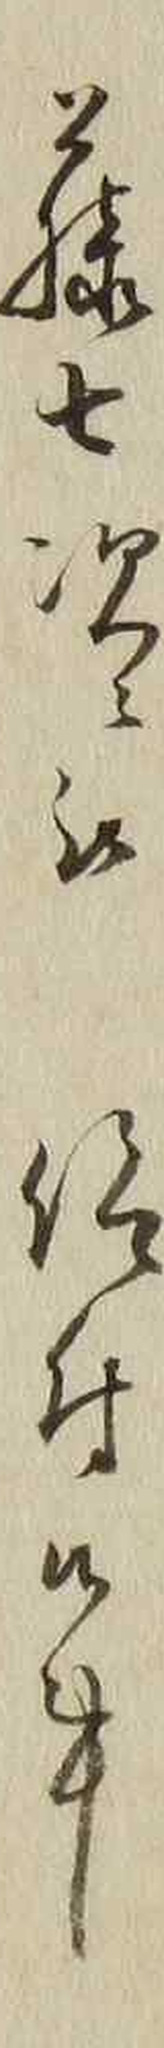藤七次ニ被仰付候事
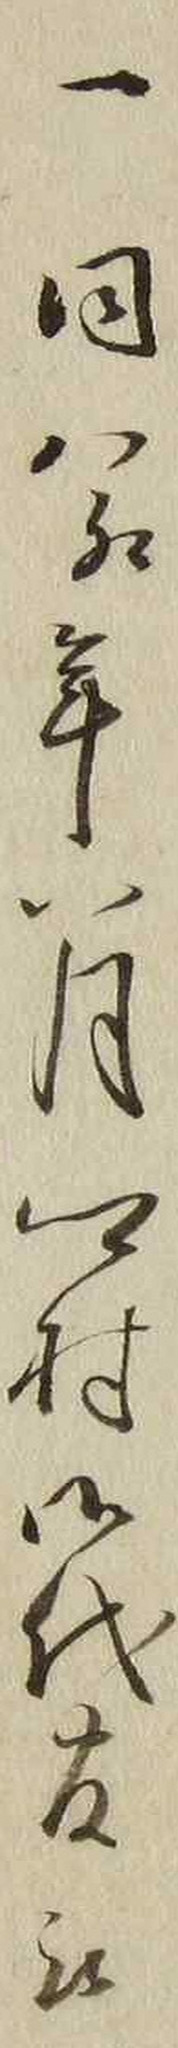一同八卯年八月郷村御代官被
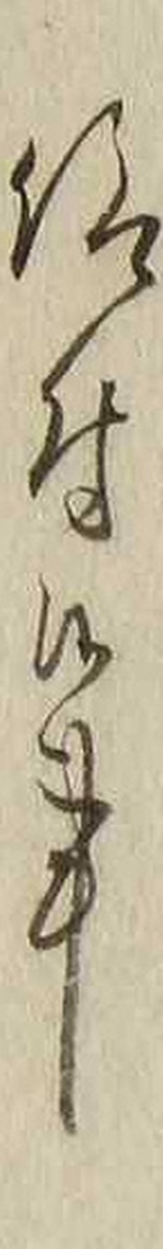仰付候事
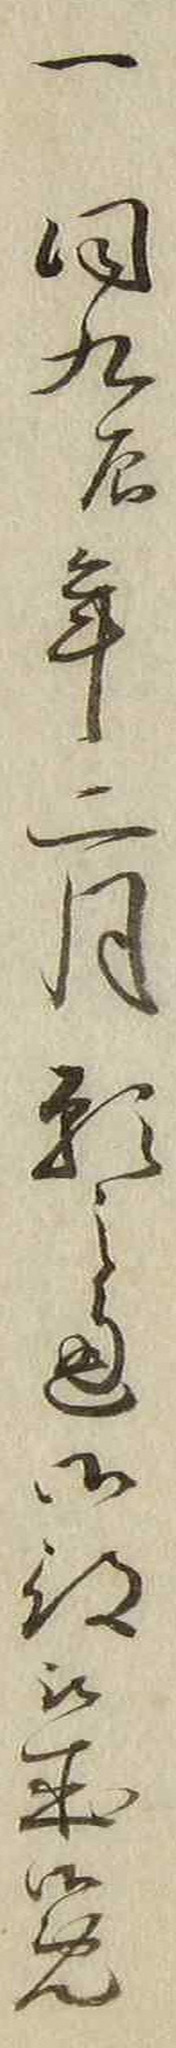一同九辰年二月願之通御役被成御免
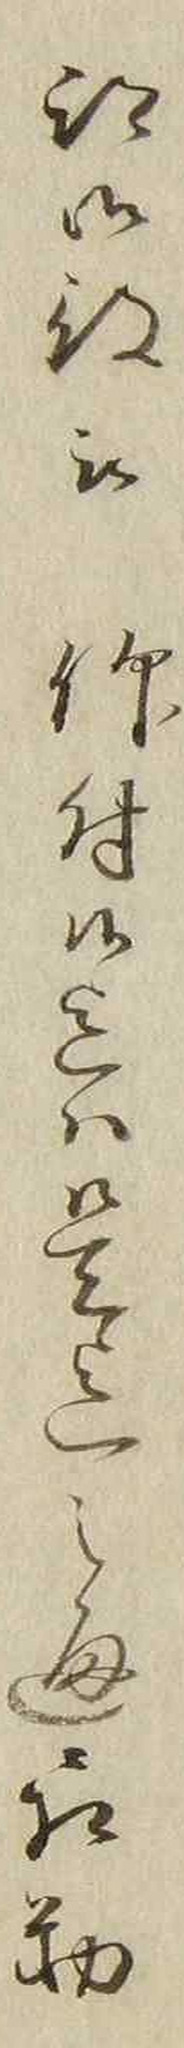跡御役被仰付候迄ハ是迄之通ニ相勤
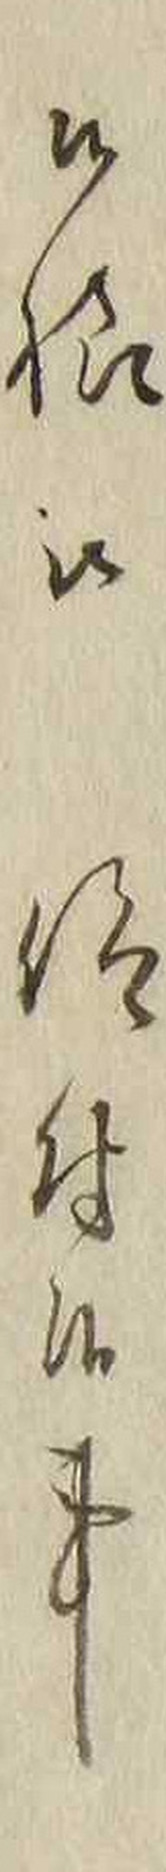候様被仰付候事
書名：諸士系譜　巻之28　い之部28
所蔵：会津若松市立会津図書館
